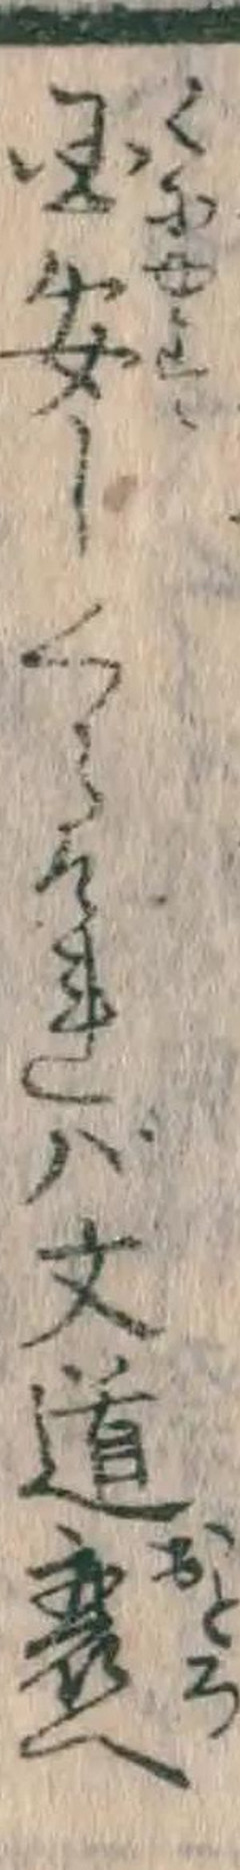国安しくらければ文道衰へ
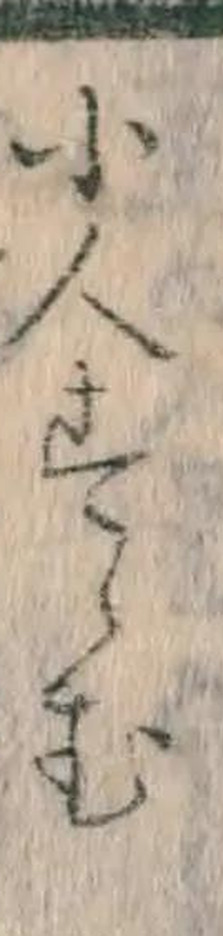小人すゝむ
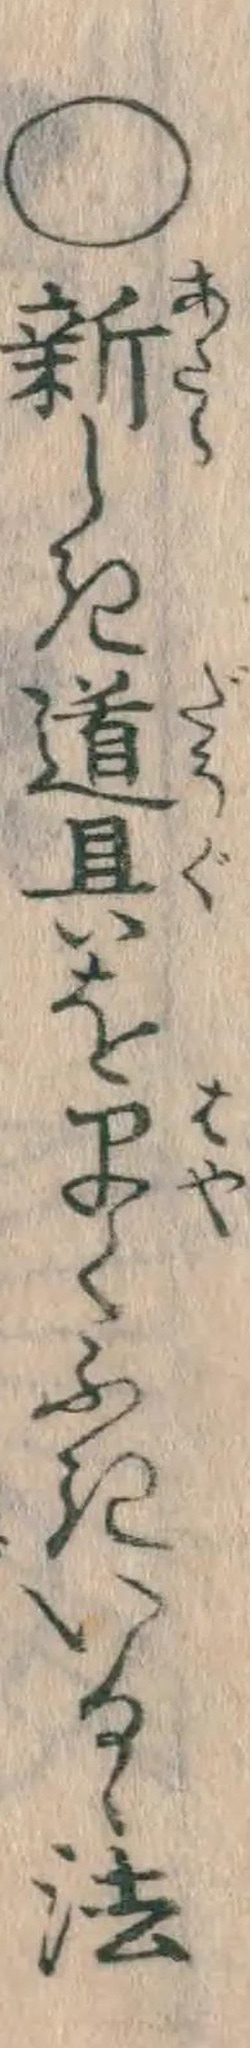○新しき道具を早くふきいるゝ法
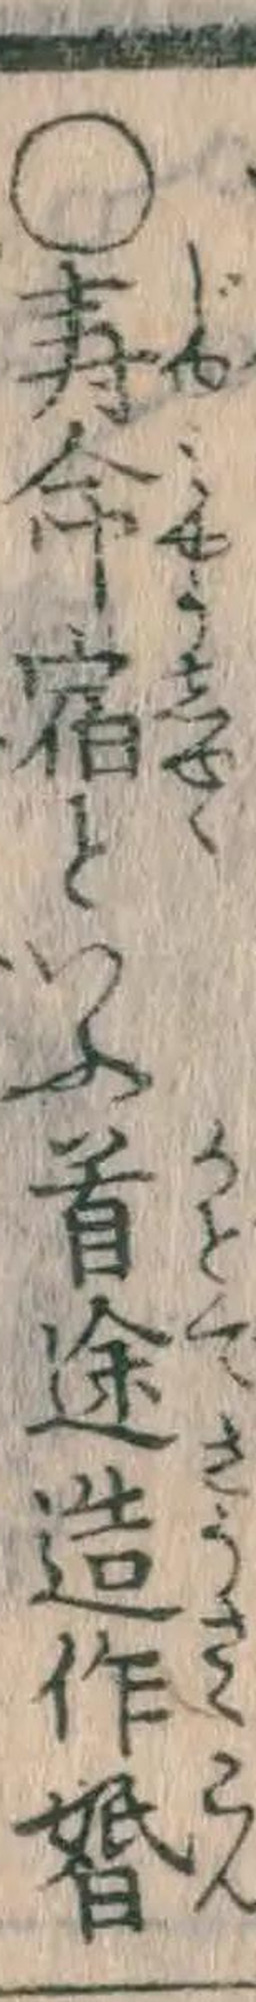○寿命宿といふ首途造作婚
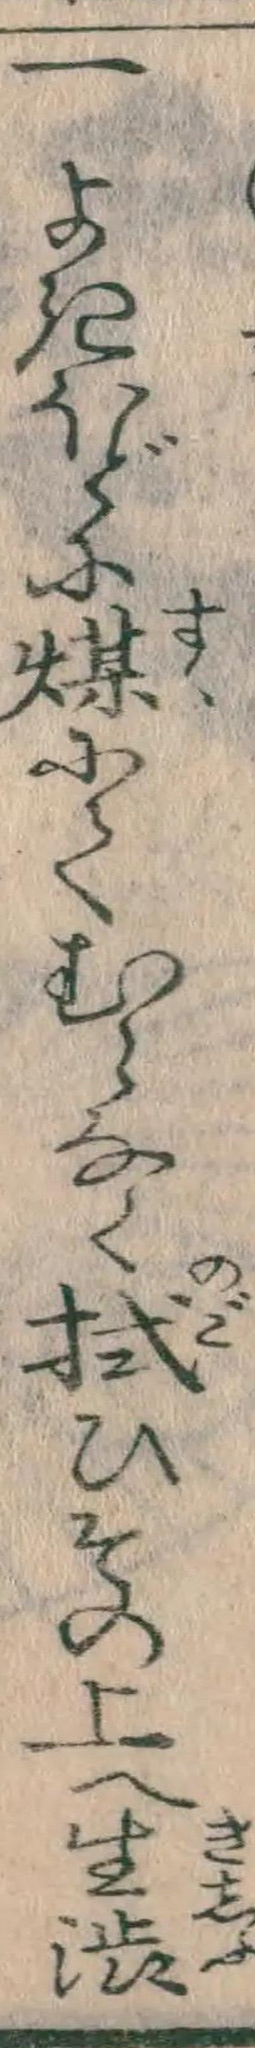一よきほどに煤にてむらなく拭ひその上へ生渋
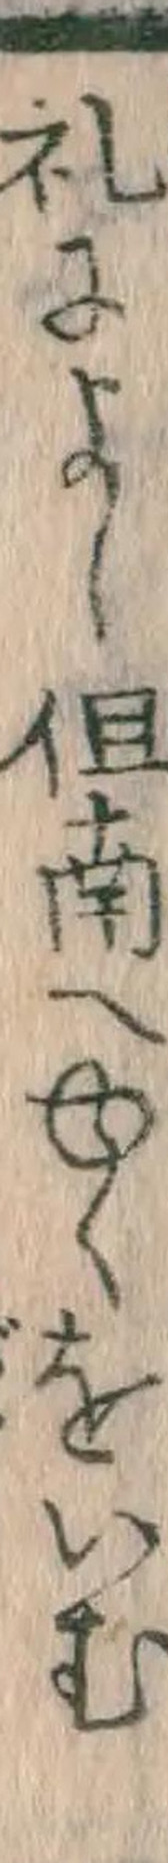礼によし但南へゆくをいむ
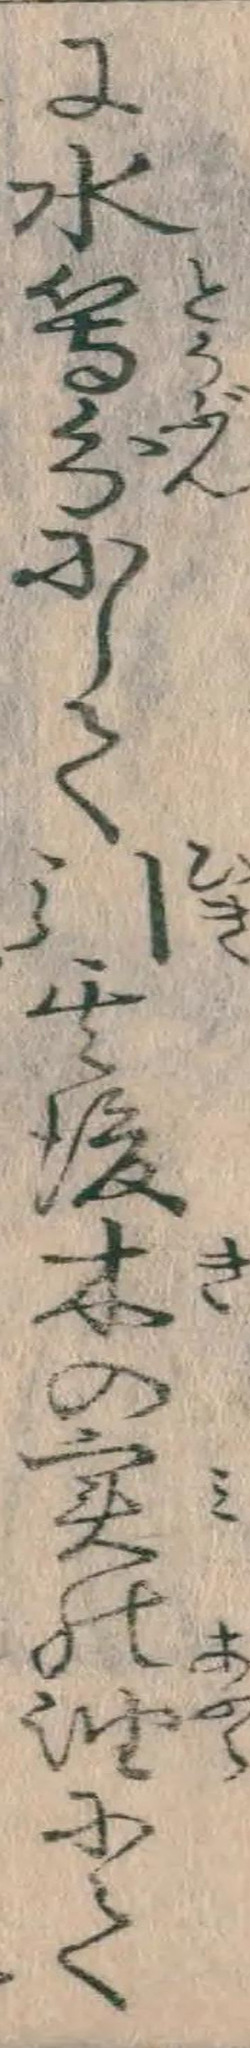に水等分にして引其後木の実の油にて
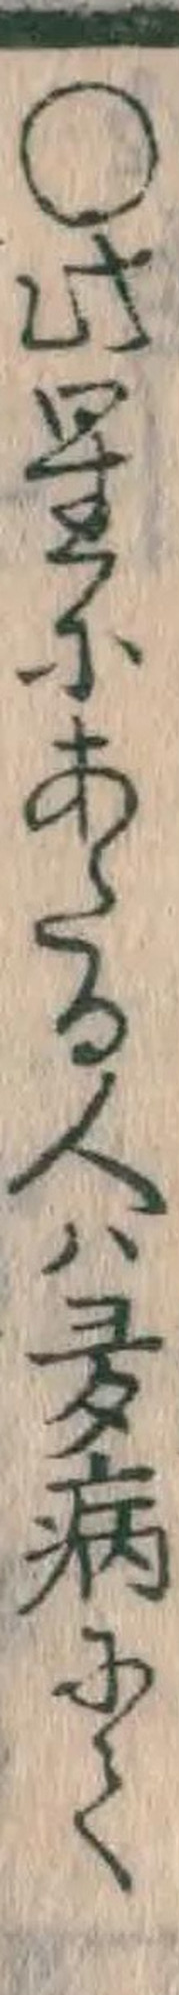○此星にあたる人は多病にて
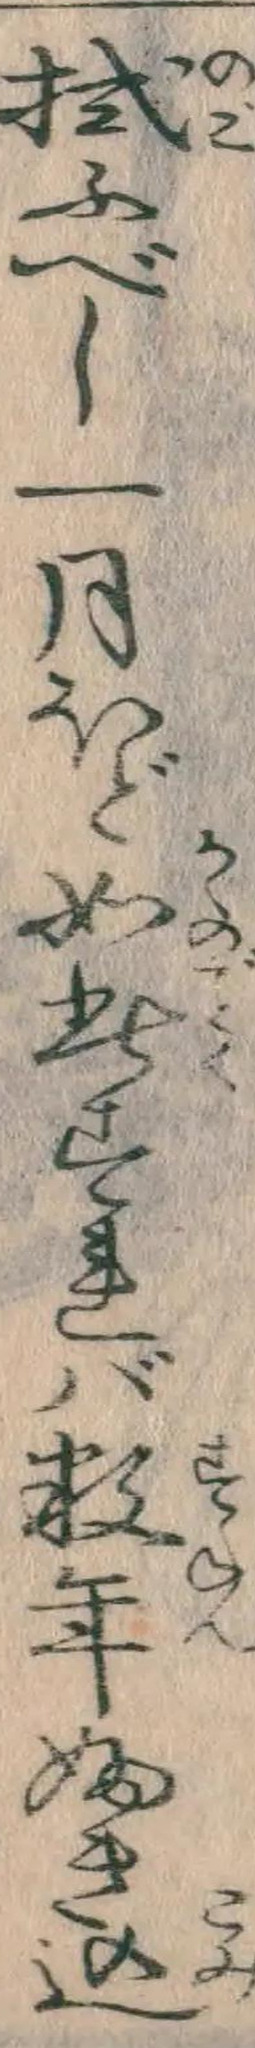拭ふべし一月ほど如此すれば数年ふき込
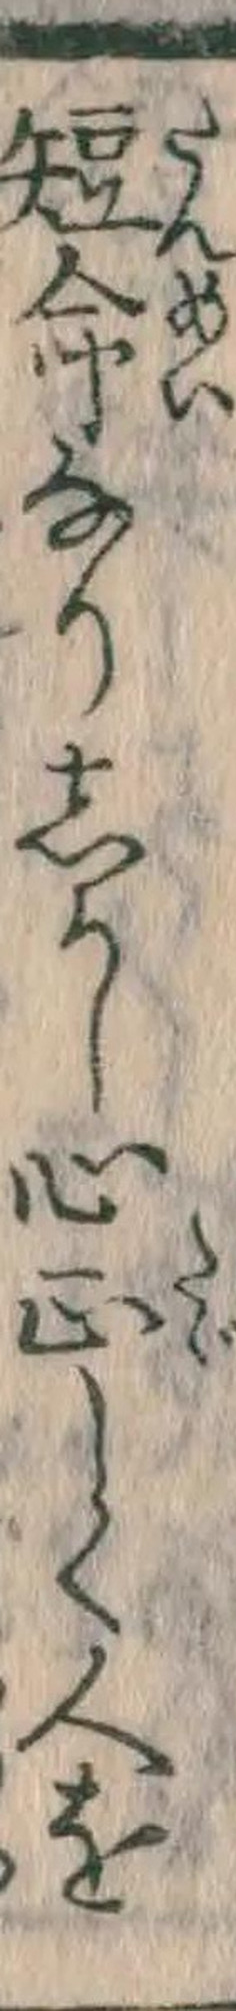短命なりしかし心正しく人を
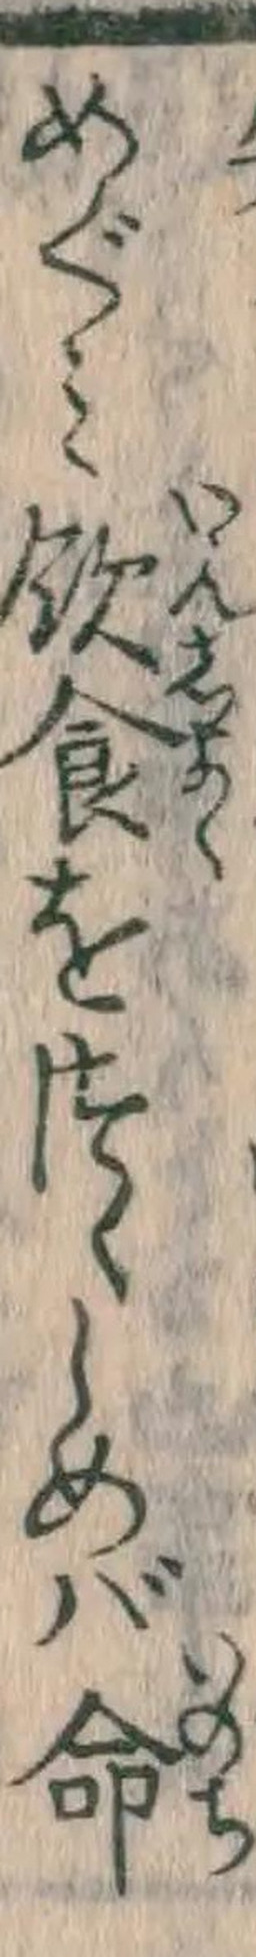めぐみ飲食をつゝしめば命
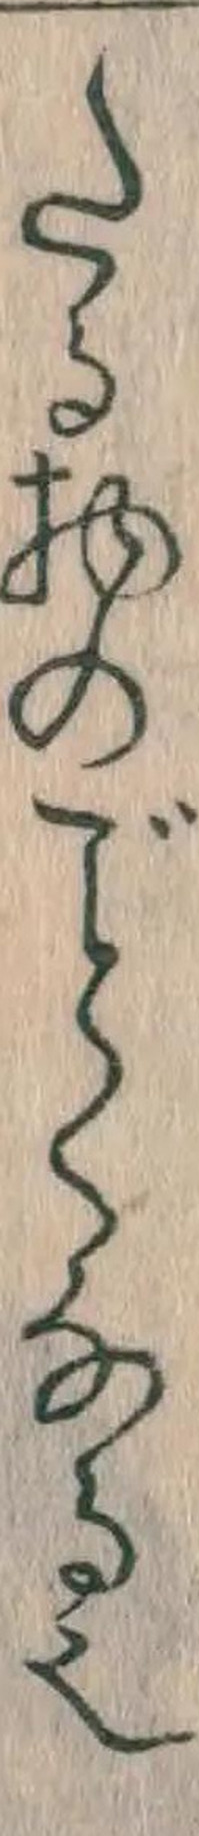たる物のごとくなる也
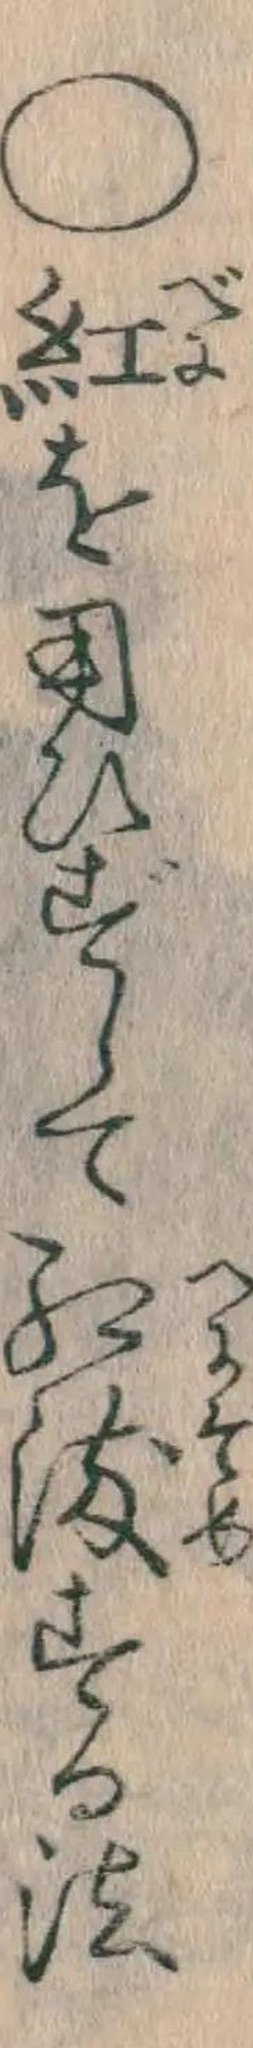○紅を用ひずして紅染する法
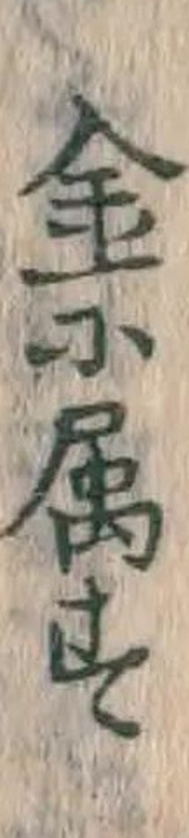奎金に属す
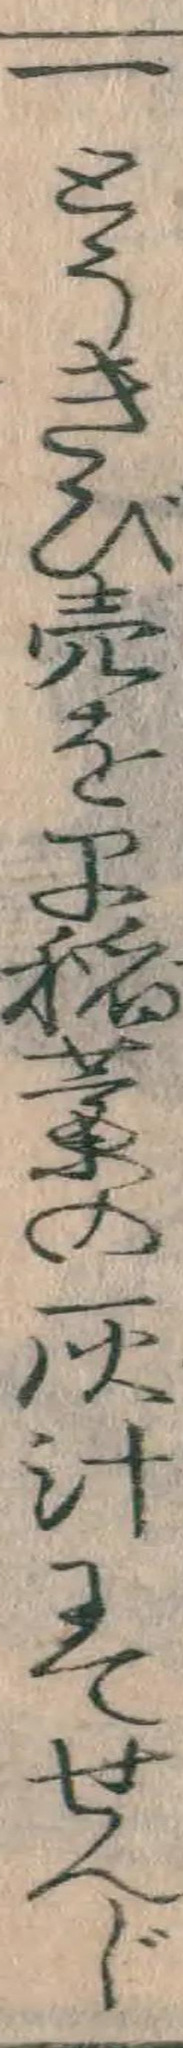一とうきび売を早稲藁の灰汁にてせんじ
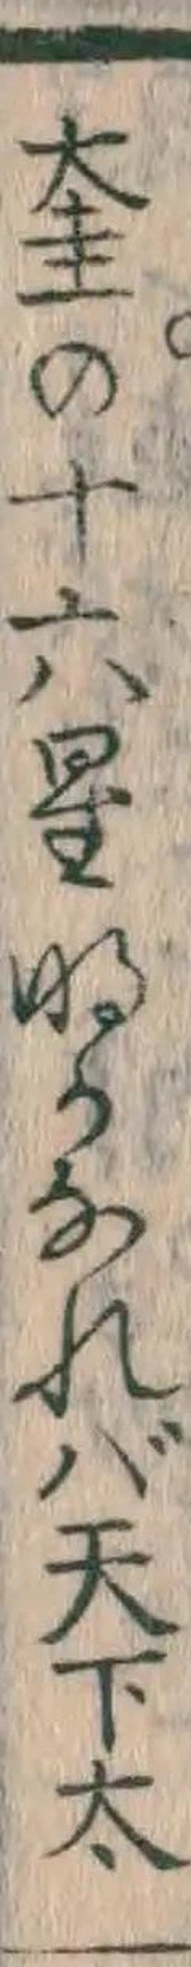奎の十六星明かなれば天下太
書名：広益秘事大全 3巻. [2]
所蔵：国立国会図書館 National Diet Library, JAPAN
